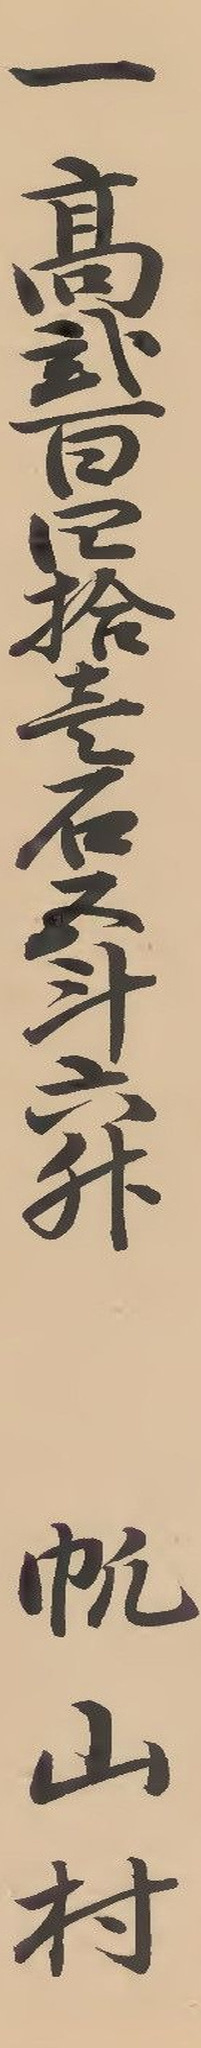一高弐百四拾壱石五斗六升帆山村

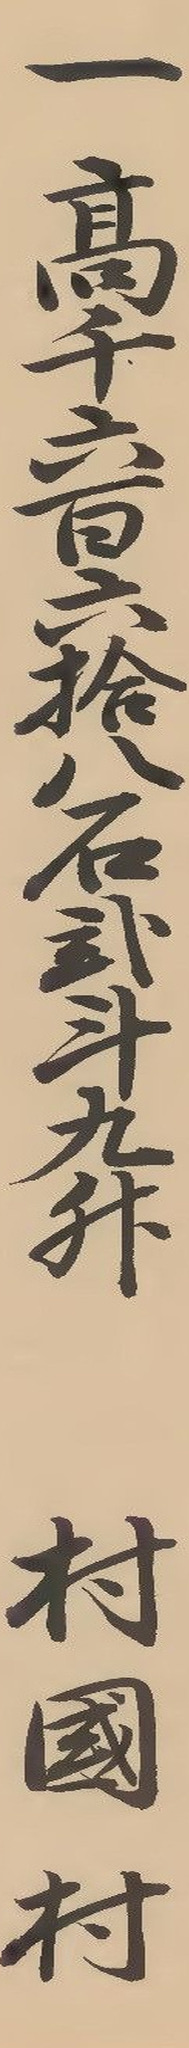一高千六百六拾八石弐斗九升村国村
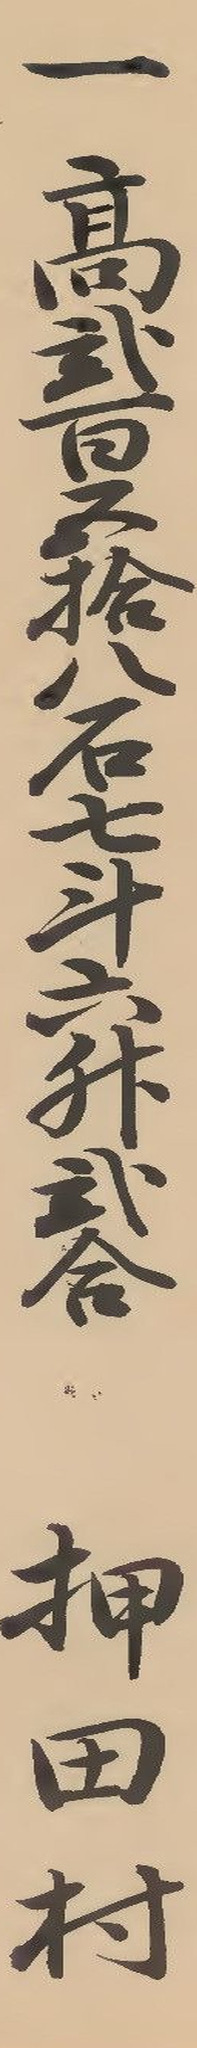一高弐百五拾八石七斗六升弐合押田村
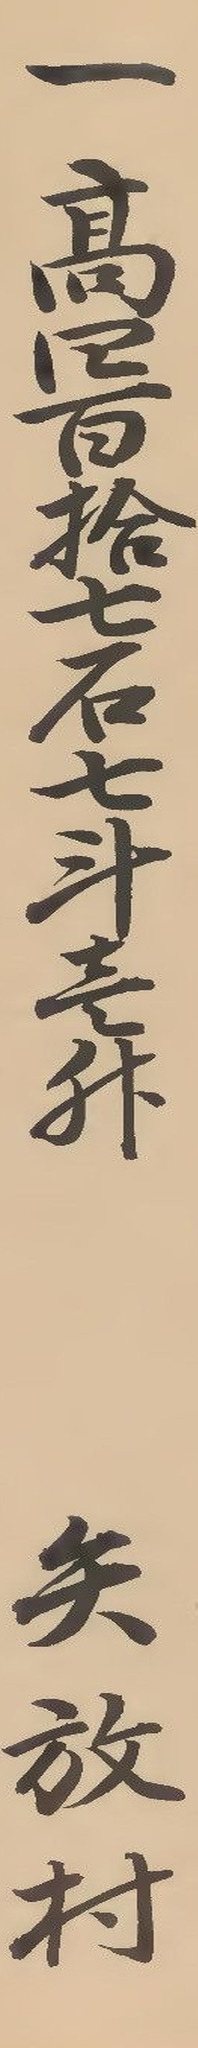一高四百拾七石七斗壱升矢放村
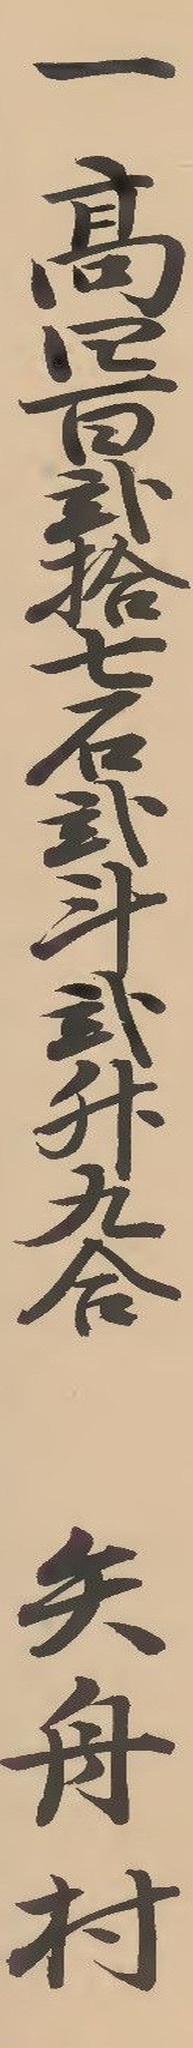一高四百弐拾七石弐斗弐升九合矢舟村
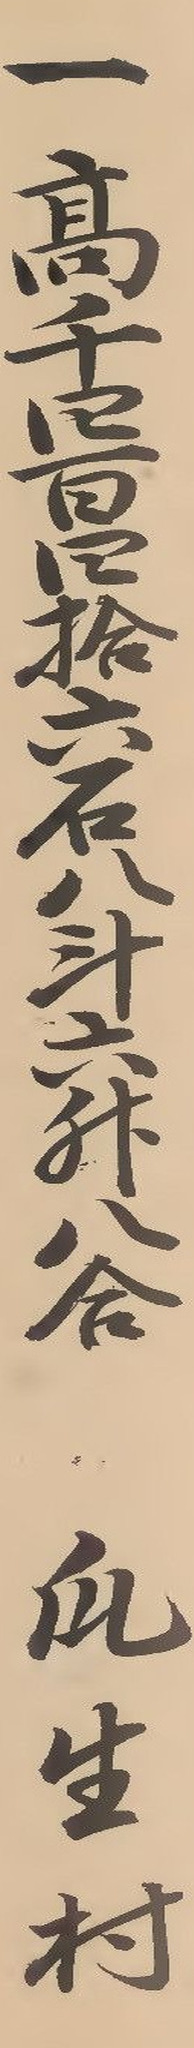一高千四百四拾六石八斗六升八合瓜生村
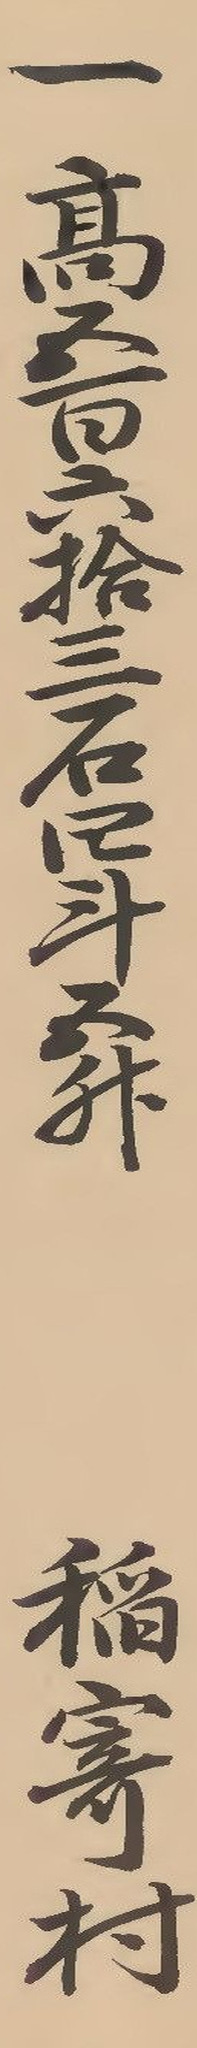一高五百六拾三石四斗五升稲寄村
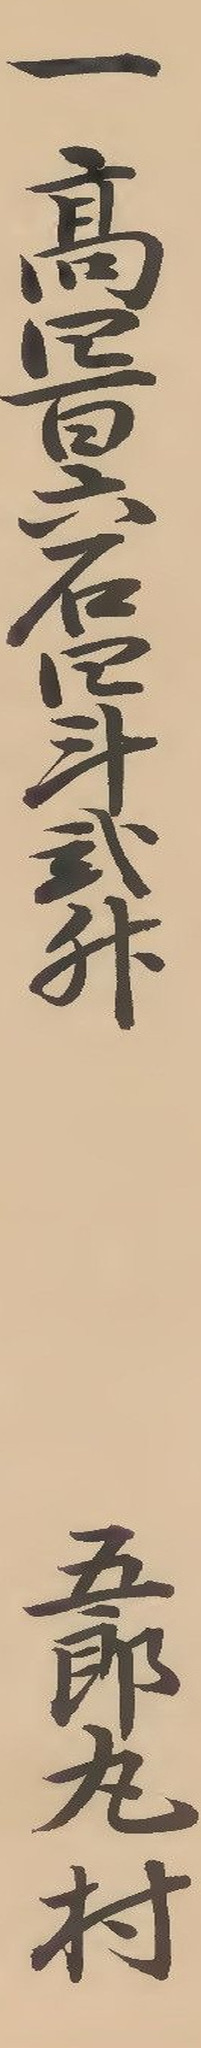一高四百六石四斗弐升五郎丸村
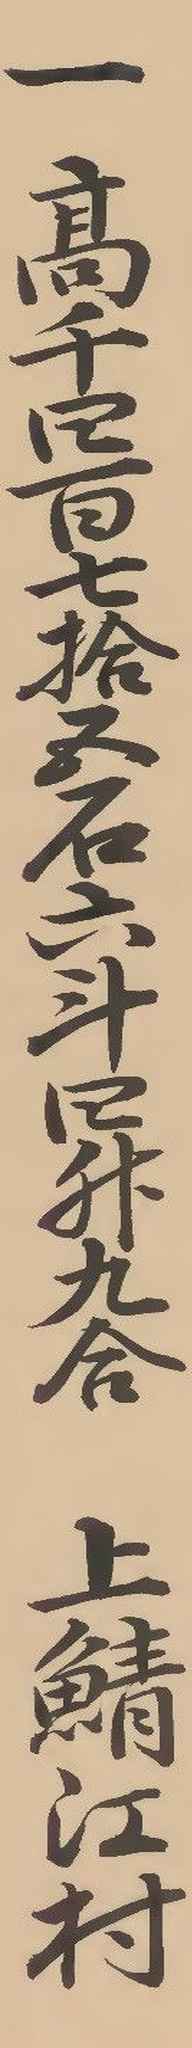一高千四百七拾五石六斗四升九合上鯖江村

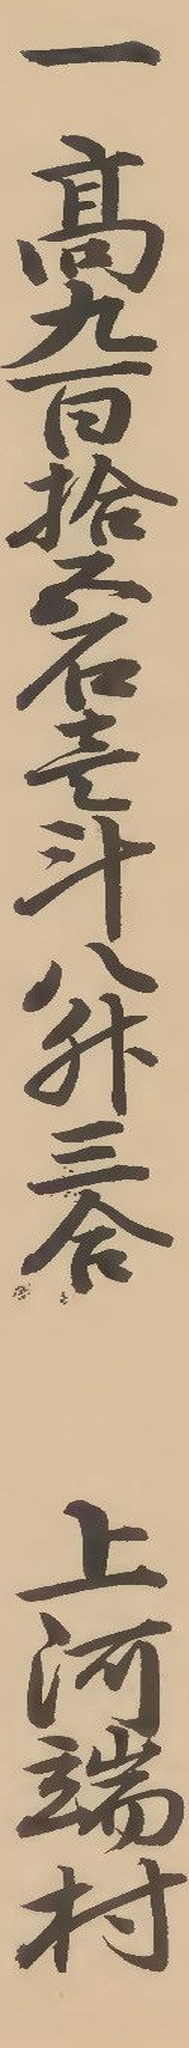一高九百拾五石壱斗八升三合上河端村
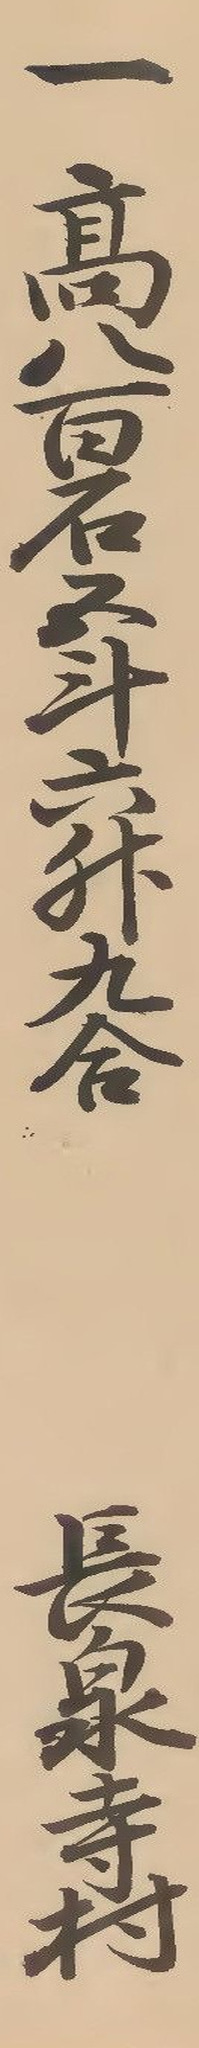一高八百石五斗六升九合長泉寺村
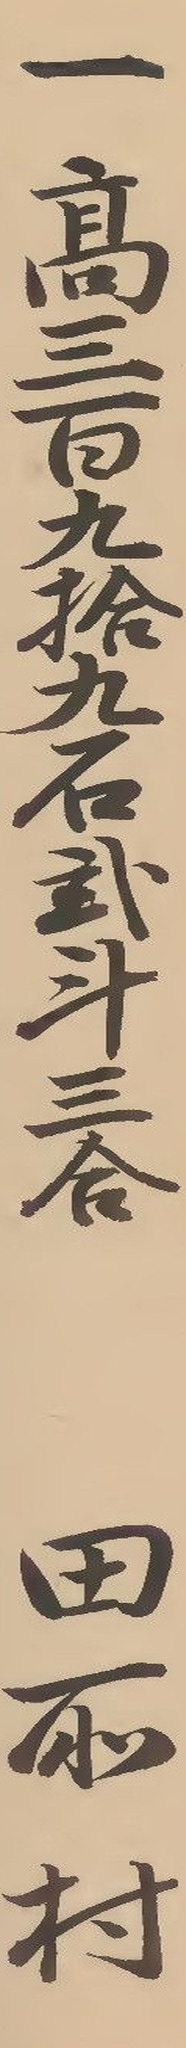一高三百九拾九石弐斗三合田所村
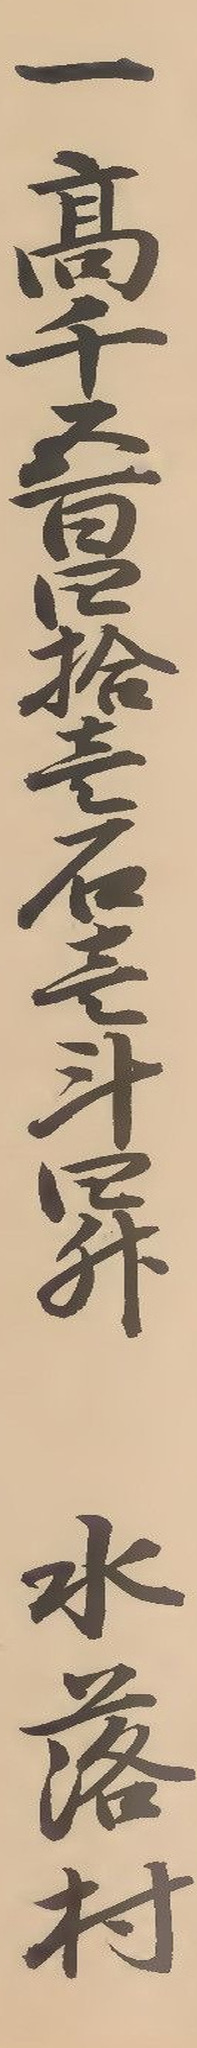一高千五百四拾壱石壱斗四升水落村
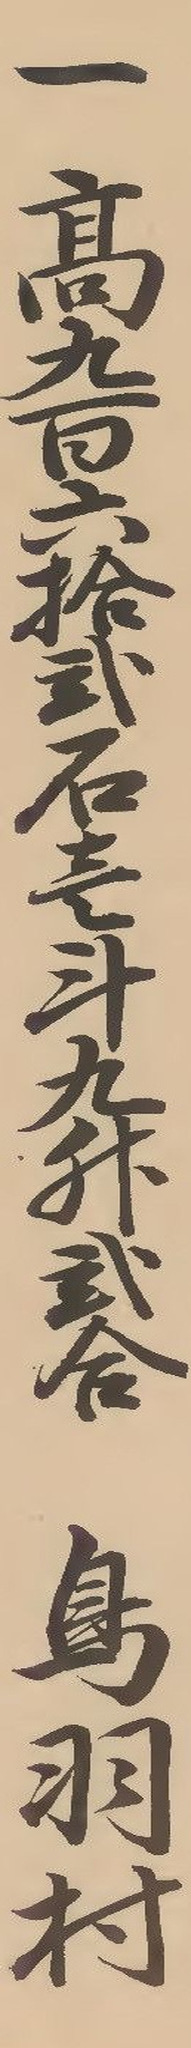一高九百六拾弐石壱斗九升弐合鳥羽村
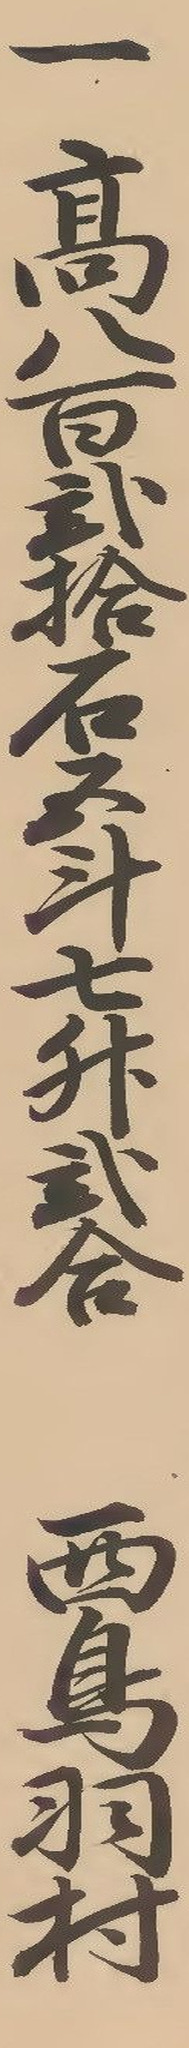一高九百六拾弐石壱斗九升弐合鳥羽村

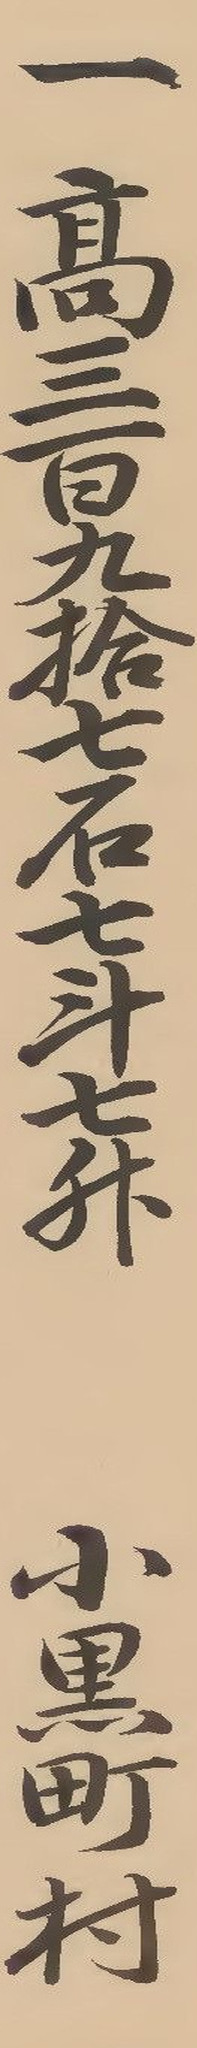一高三百九拾七石七斗七升小黒町村
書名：越前国郷帳
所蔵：国立公文書館 National Archives of Japan
